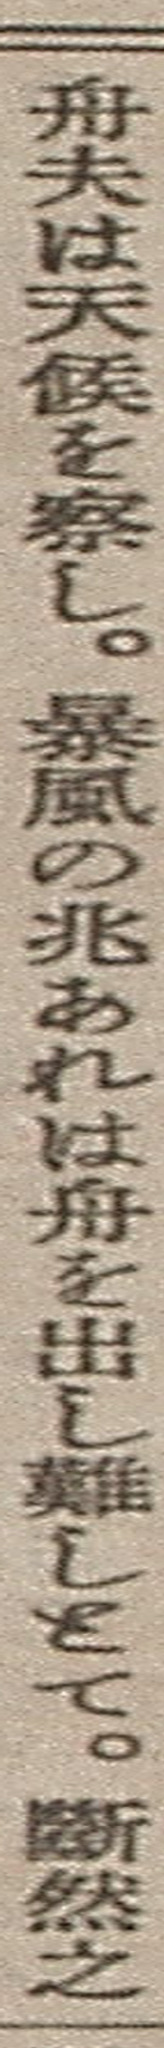舟夫は天候を察し。暴風の兆あれは舟を出し難しとて。断然之
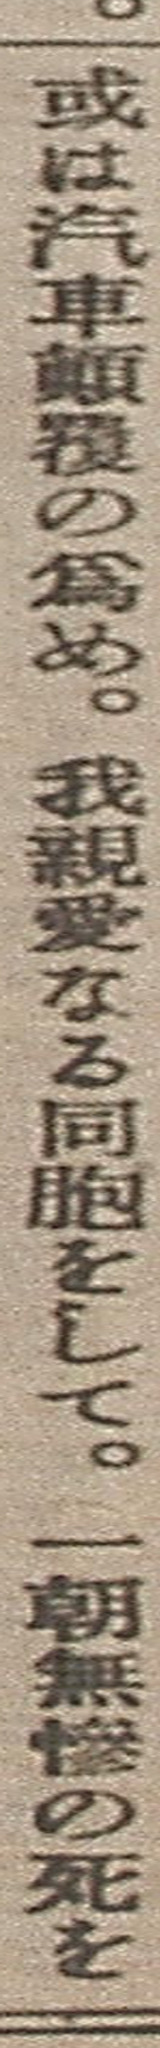或は汽車転覆の為め。我親愛なる同胞をして。一朝無惨の死を
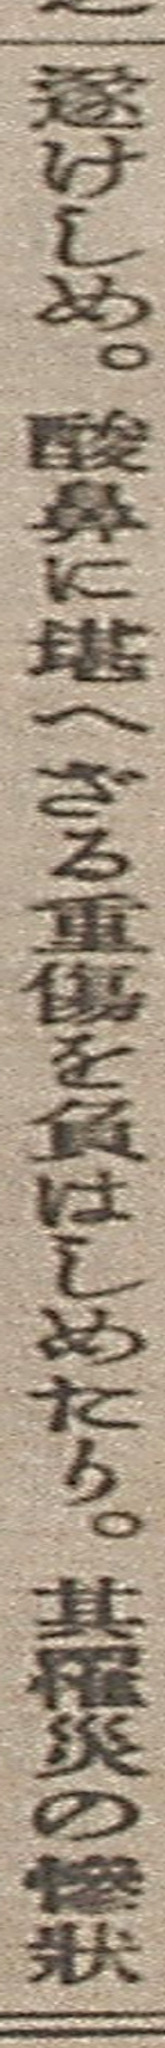遂けしめ。酸鼻に堪へざる重傷を負はしめたり。其罹災の惨状
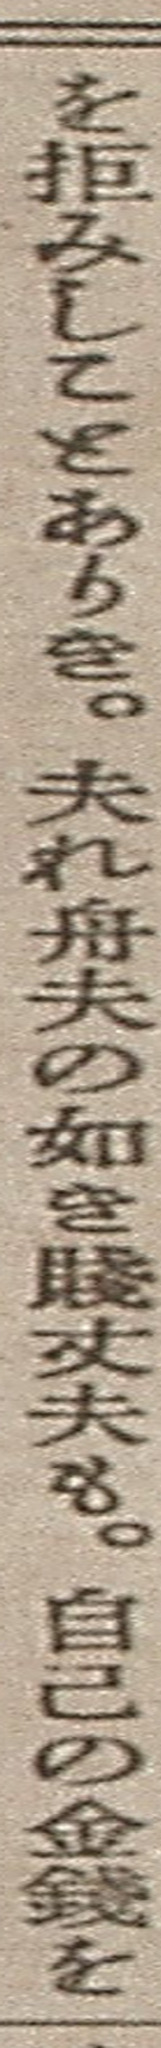を拒みしことありき。夫れ舟夫の如き賤丈夫も。自己の金銭を
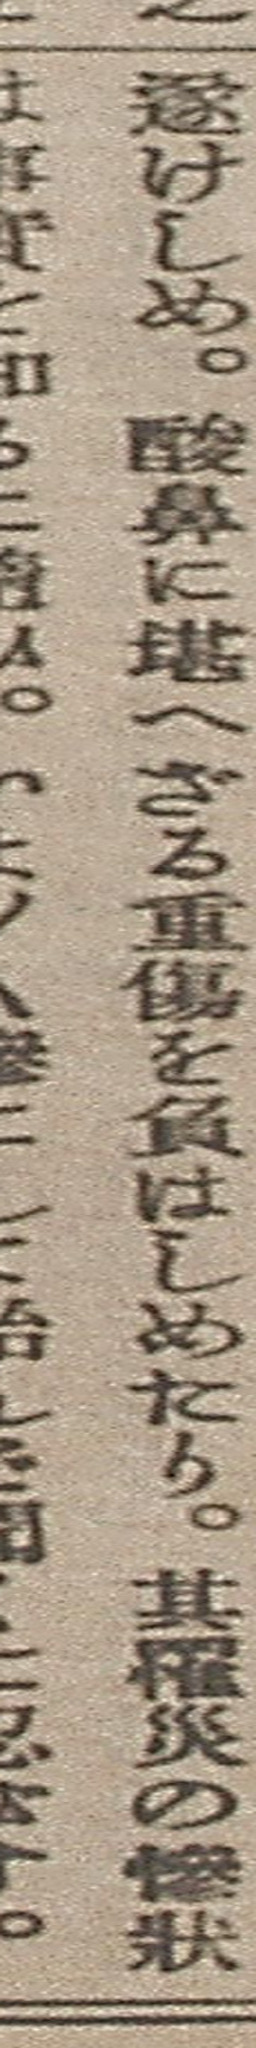は事実を知るに随ひ。いよ〳〵惨にして殆んど聞くに忍びす。
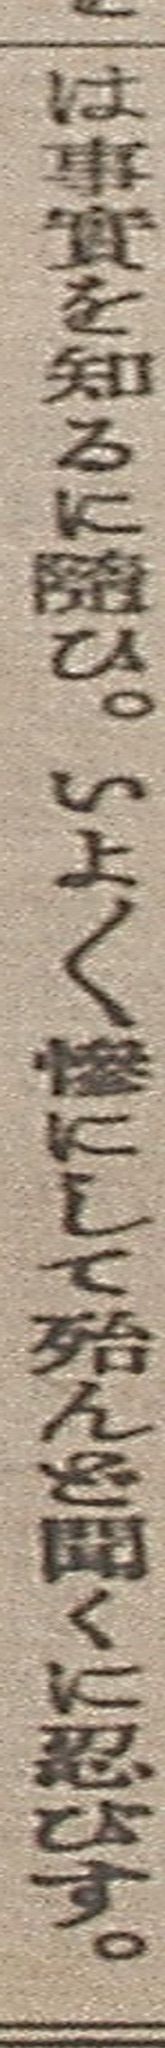は事実を知るに随ひ。いよ〳〵惨にして殆んど聞くに忍びす。
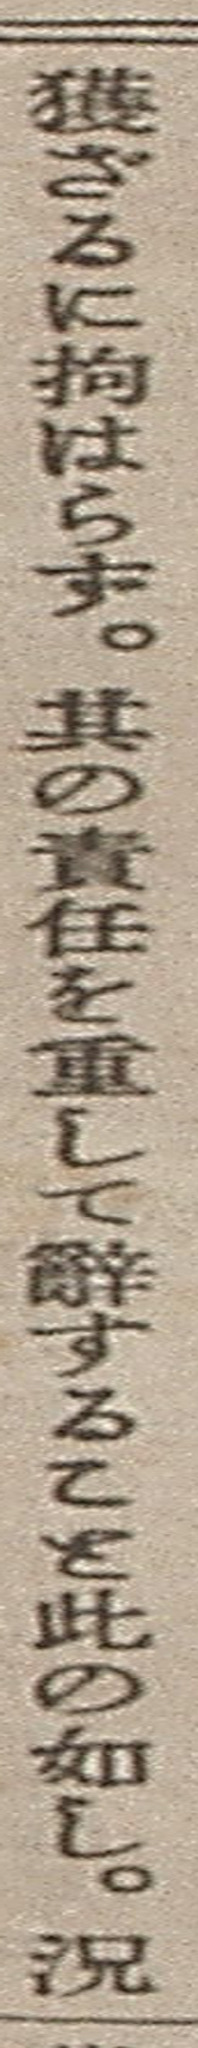獲ざるに拘はらず。其の責任を重して辞すること此の如し。況
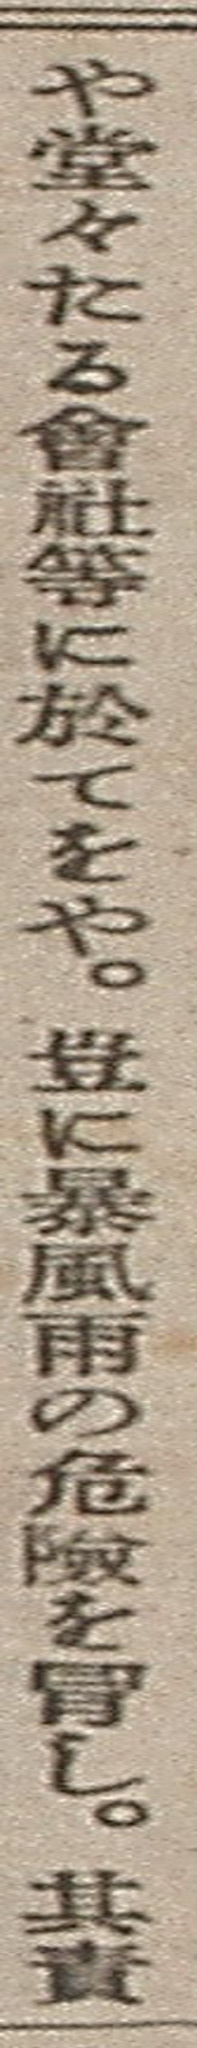や堂々たる会社等に於てをや。豈に暴風雨の危険を冒し。其責
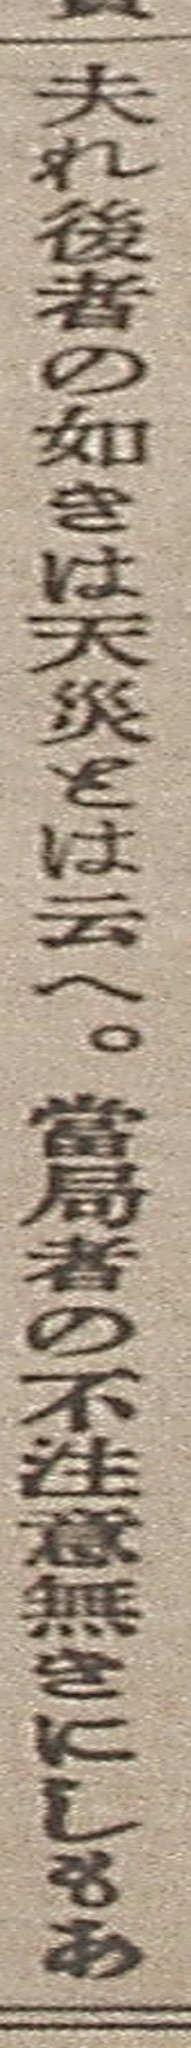夫れ後者の如きは天災とは云へ。当局者の不注意無きにしもあ
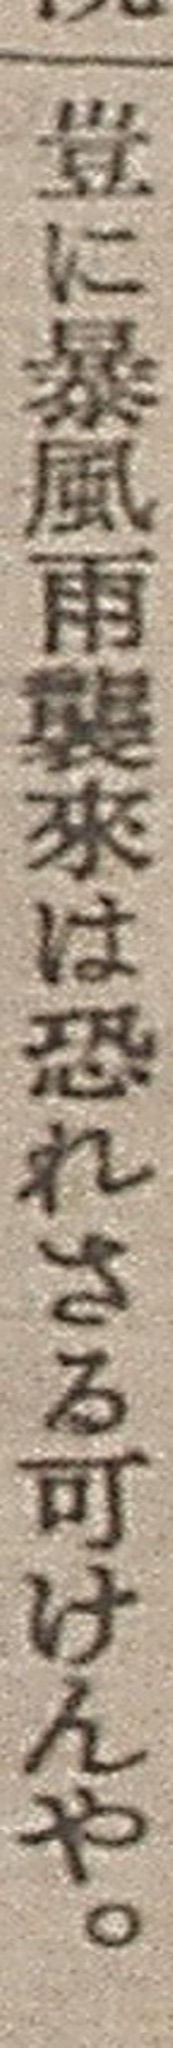豈に暴風雨襲来は恐れさる可けんや。
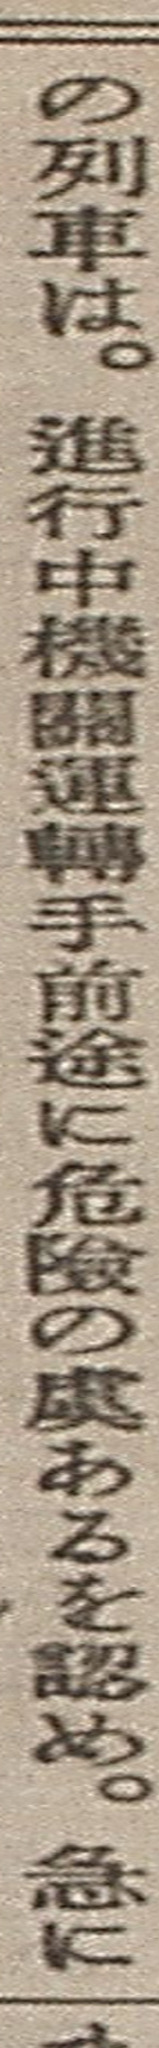の列車は。進行中機関運転手前途に危険の虞あるを認め。急に
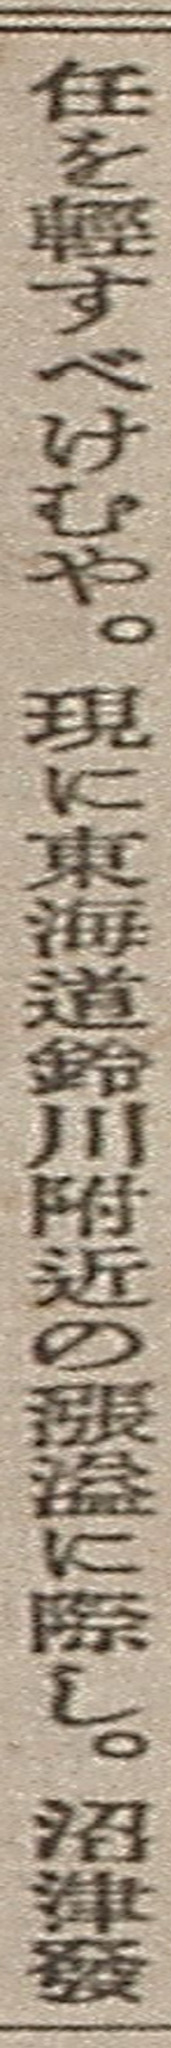任を軽すべけむや。現に東海道鈴川附近の漲溢に際し。沼津発
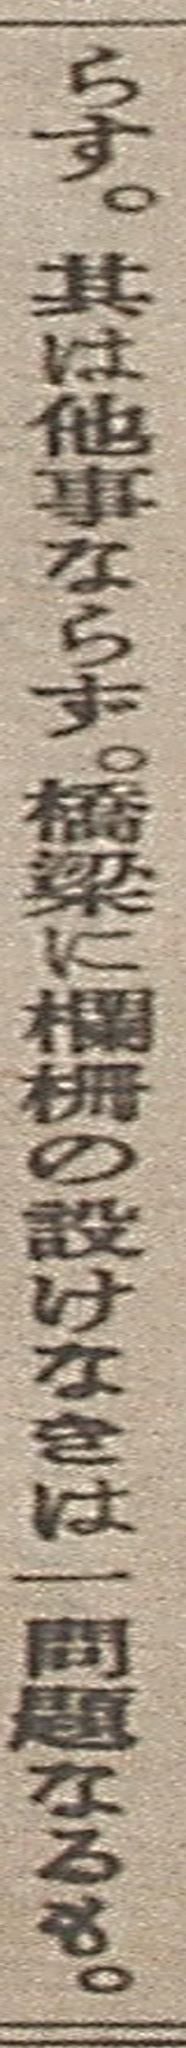らす。其は他事ならず。橋梁に欄柵の設けなきは一問題なるも。
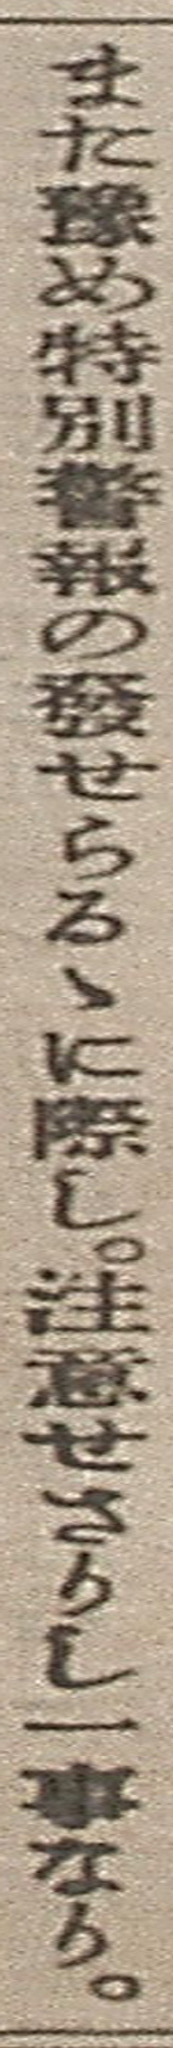また予め特別警報の発せらるゝに際し。注意させりし一事なり。
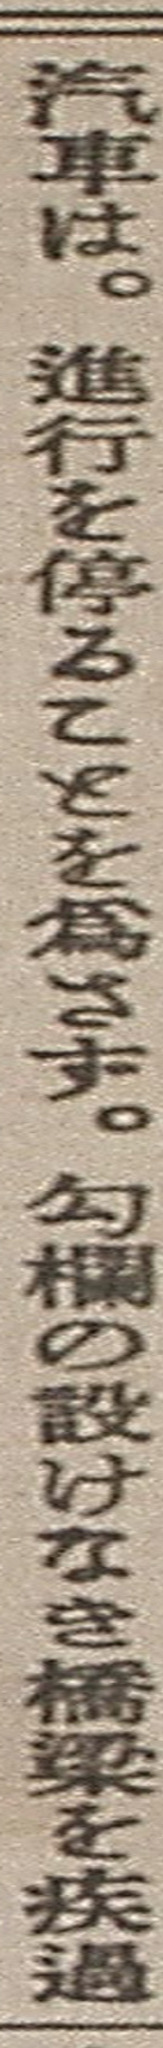汽車は。進行を停ることを為さず。勾欄の設けなき橋梁を疾過
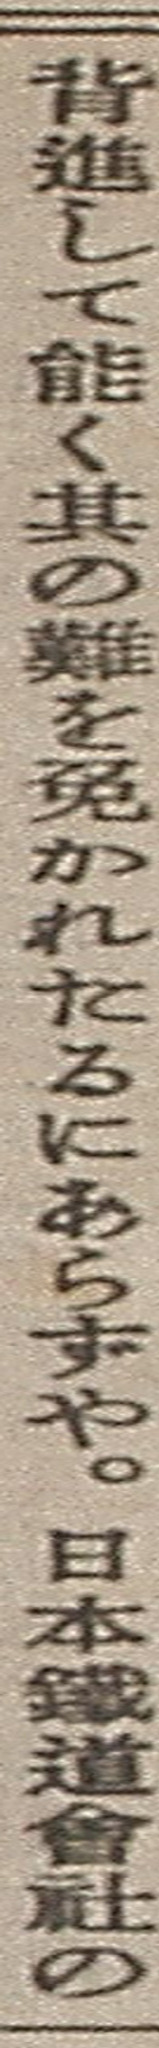背進して能く其の難を免かれたるにあらずや。日本鉄道会社の
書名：風俗畫報臨時増刊第百九十九號　明治三十二年十月各地災害圖會（前編之續）
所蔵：東京大学地震研究所図書室 Earthquake Research Institute Library, The University of Tokyo, JAPAN
